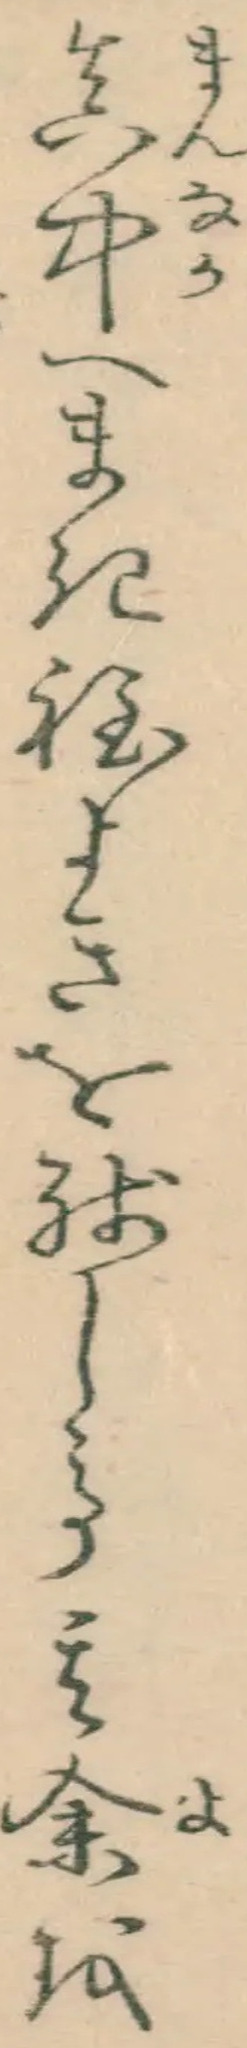真中へまき程よきを残して其余を
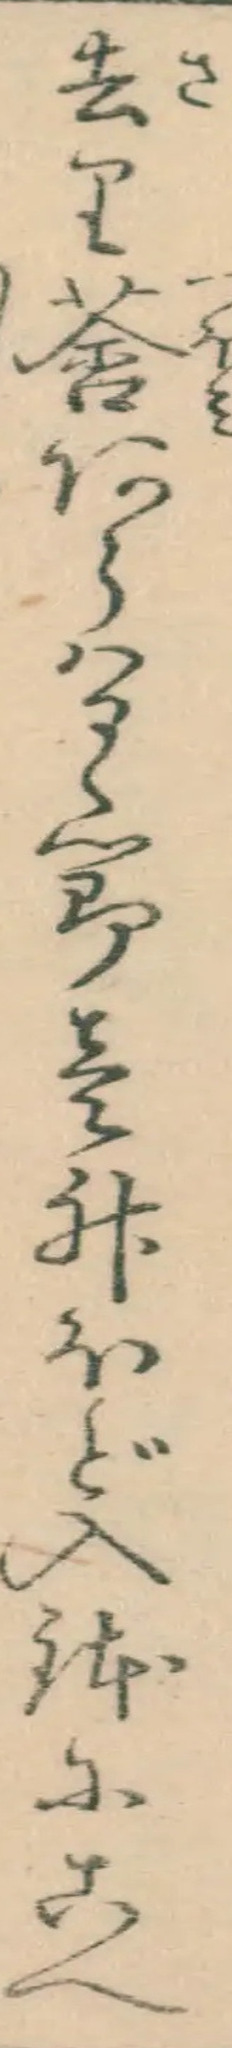去り莟あらハるゝ節壱升ほど入鉢にこへ
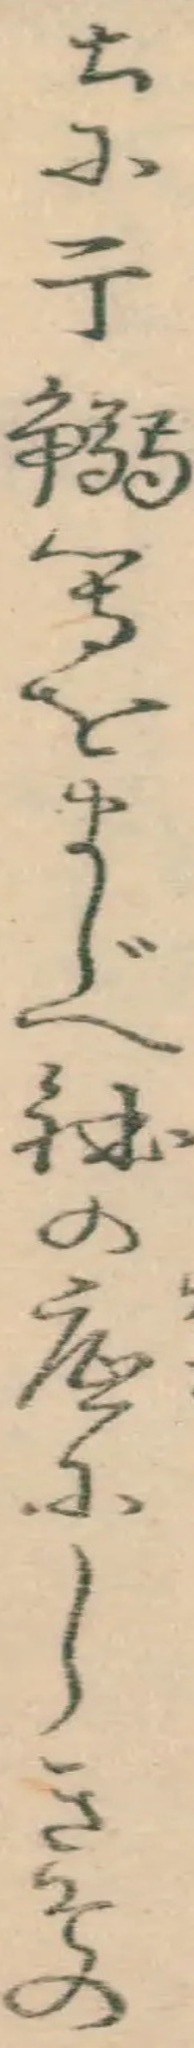土に干鰯等をまじへ鉢の底にしきその
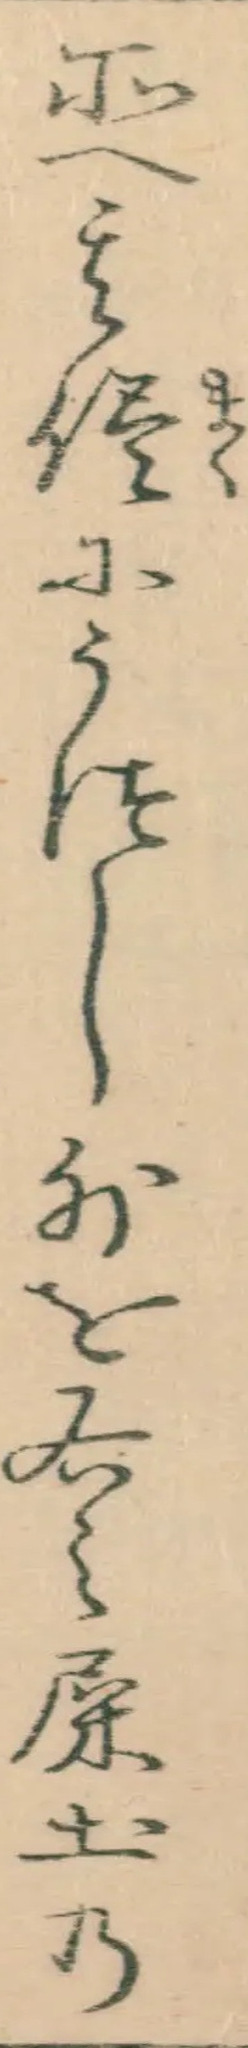所へ其侭にうつし外を右の屎土の
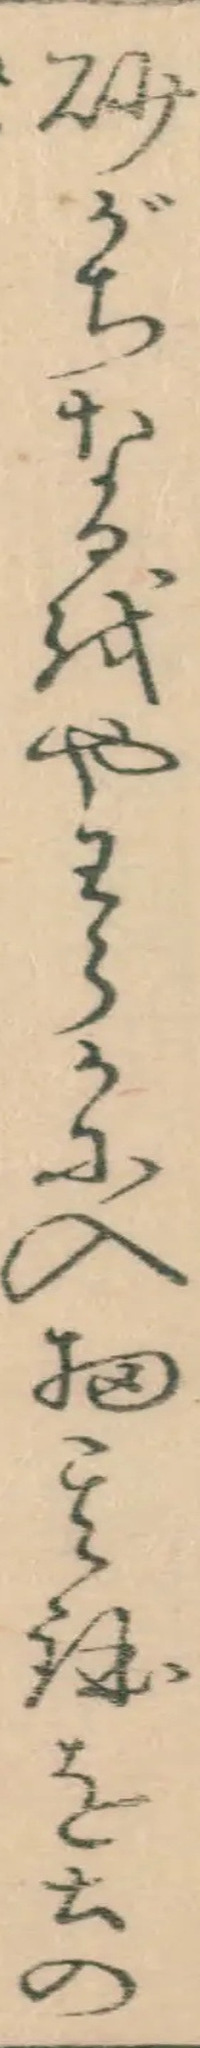砂がちなるをやわらかに入扨其鉢を土の
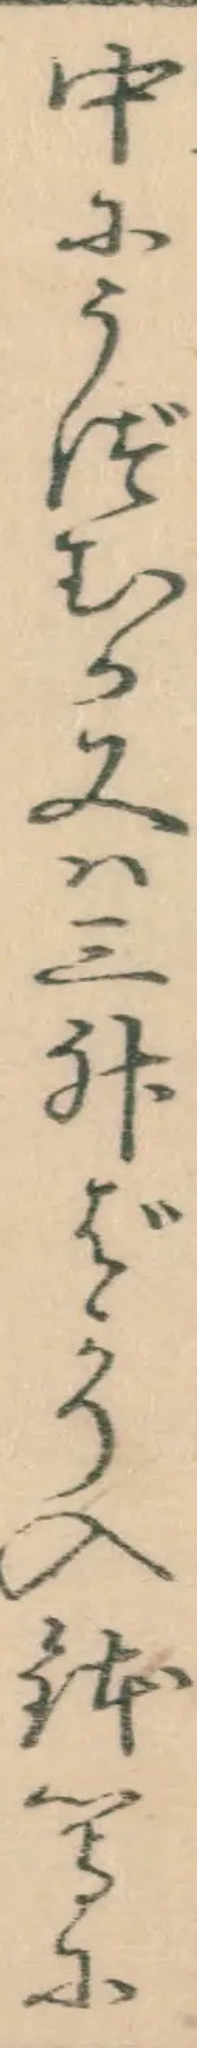中にうづむる又ハ三升ばかり入鉢等に
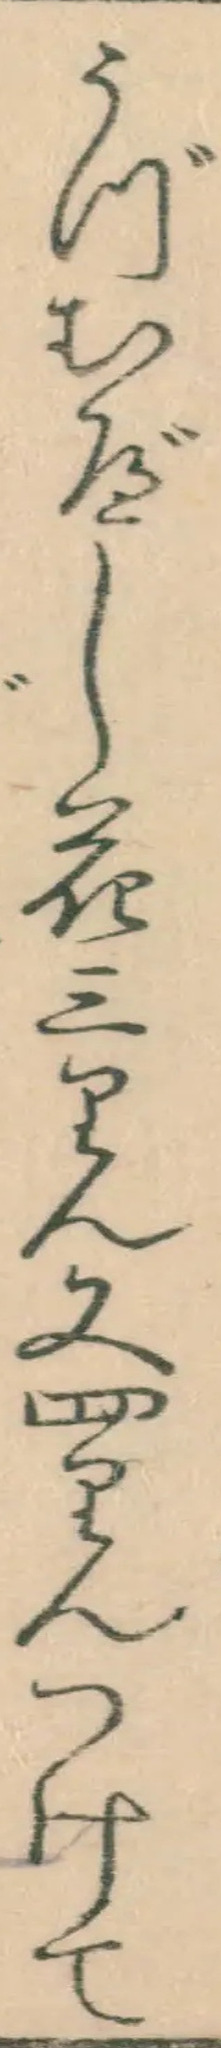うづむべし花三りん又四りんつけて
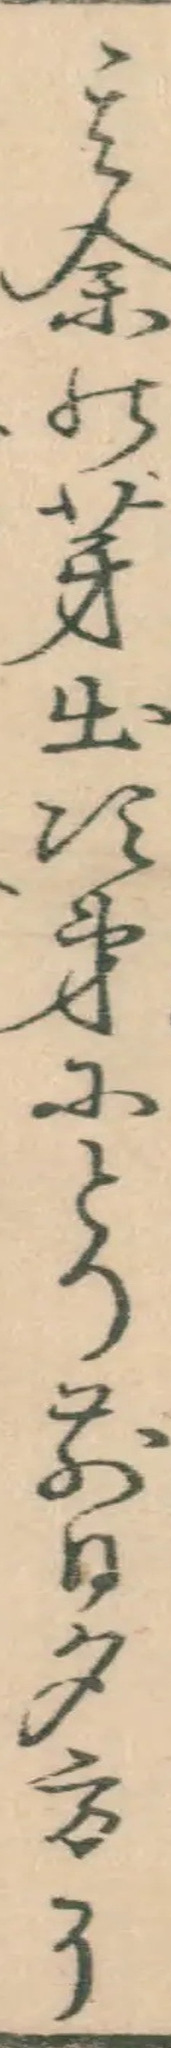其余の芽出次第にとり前日夕方に
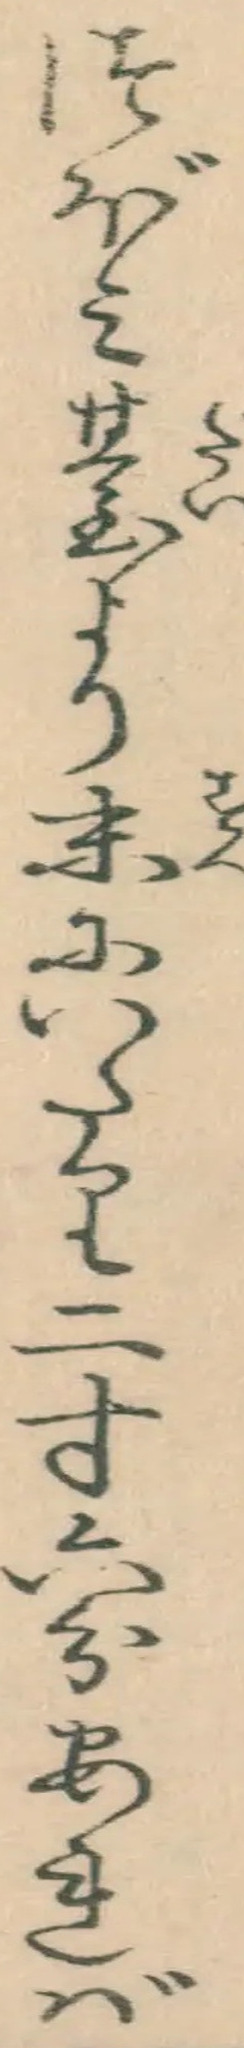つぼミ臺より末にいたり二寸六分あれバ
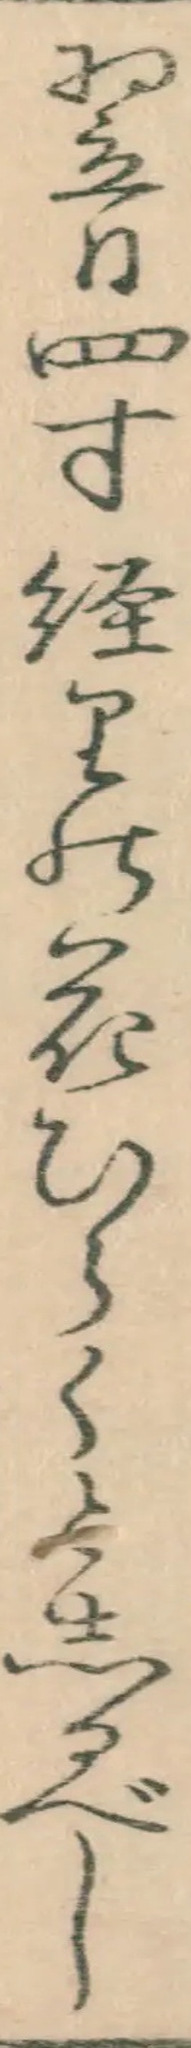翌日四寸経りの花ひらくとしるべし
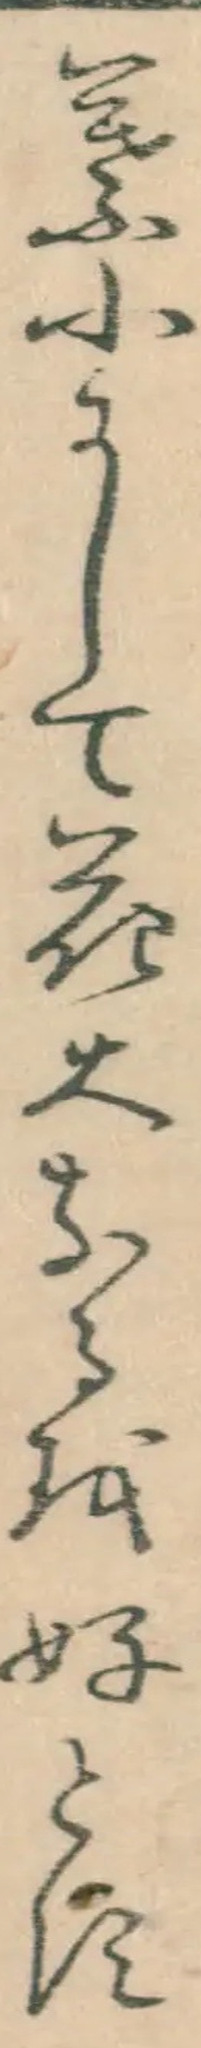葉小にして花大なるを好とす

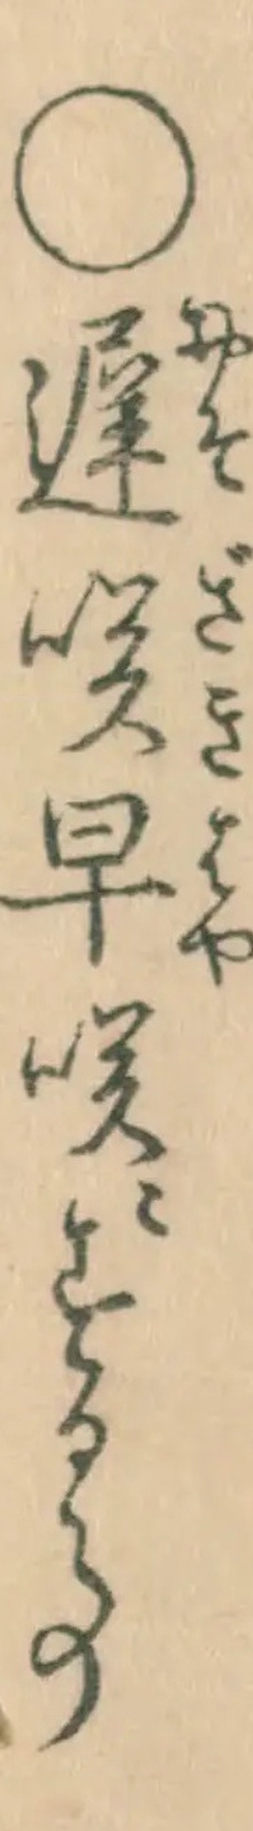〇遅咲早咲ニする事
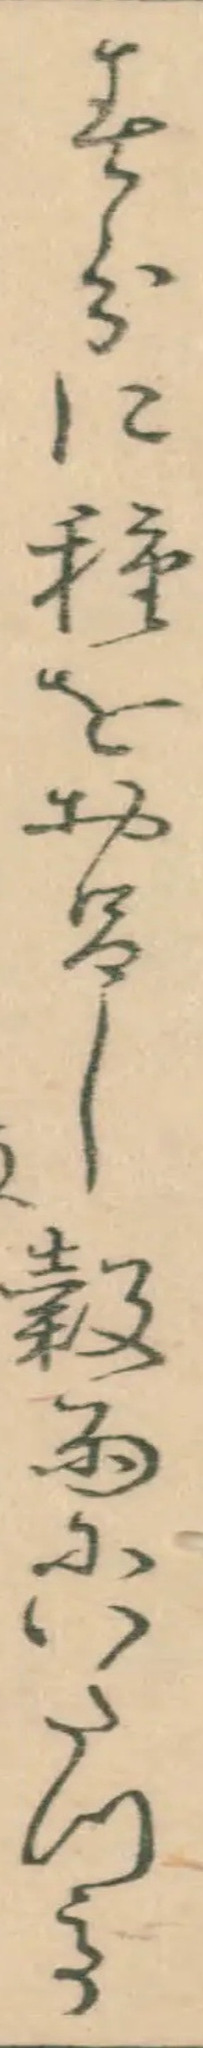春分に種をおろし穀雨にいたつて
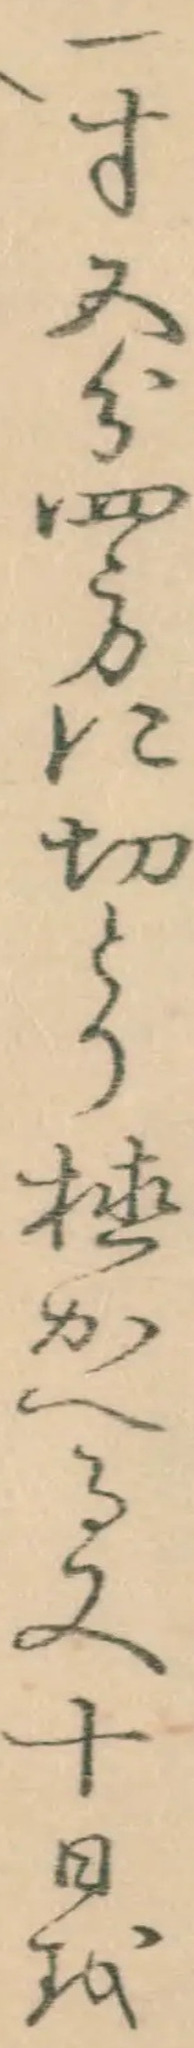一寸五分四方に錐切とり植かへかへる又十日を
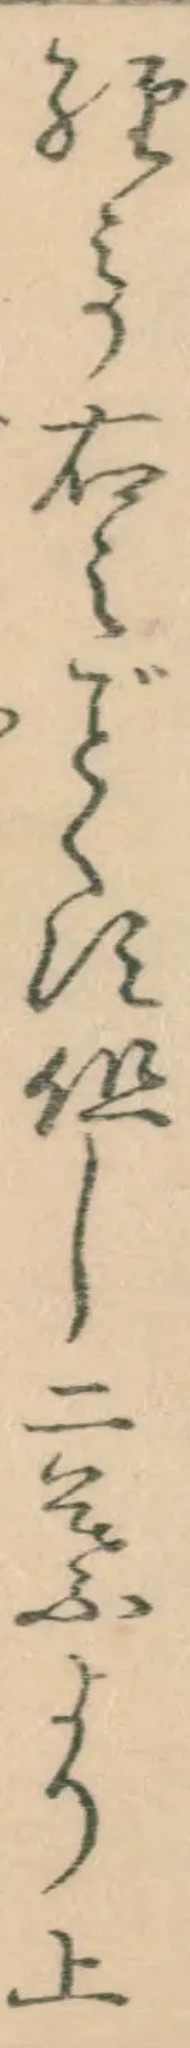経て右のごとくす但し二葉より上
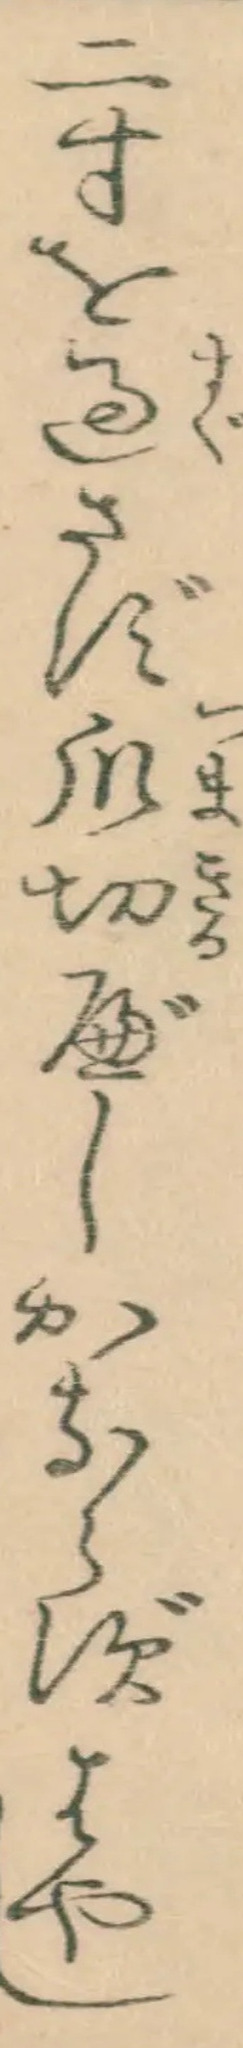二寸を過さず爪切べしかならずはやし
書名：花壇朝顔通 2巻. [2]
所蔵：国立国会図書館 National Diet Library, JAPAN
